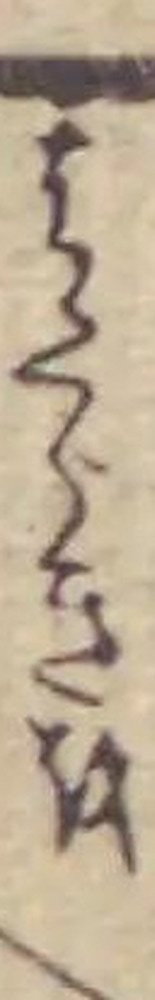はたらきを
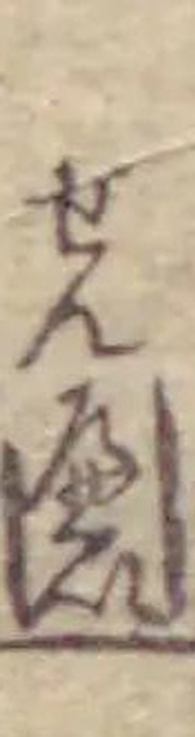せんへい
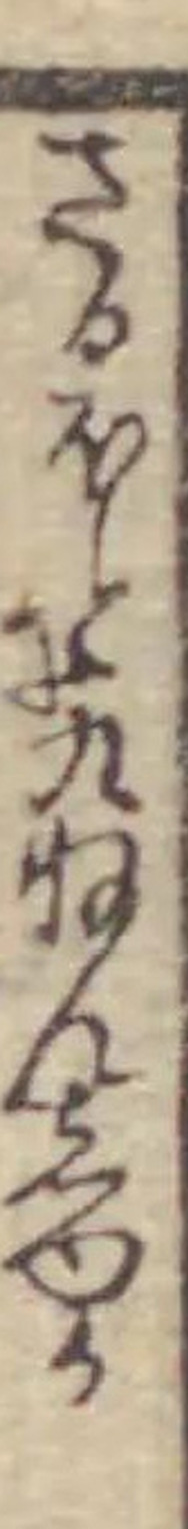さるほとに九ねんしゆか
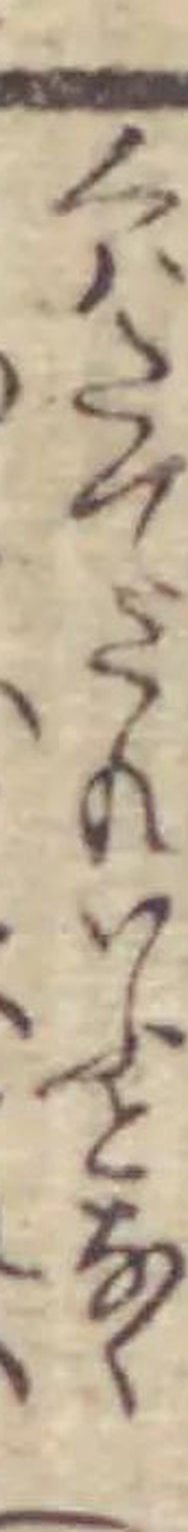くはたてたれいふとなく
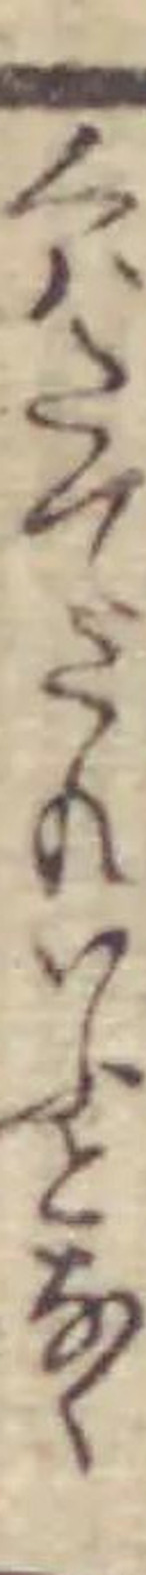くはたてたれいふとなく
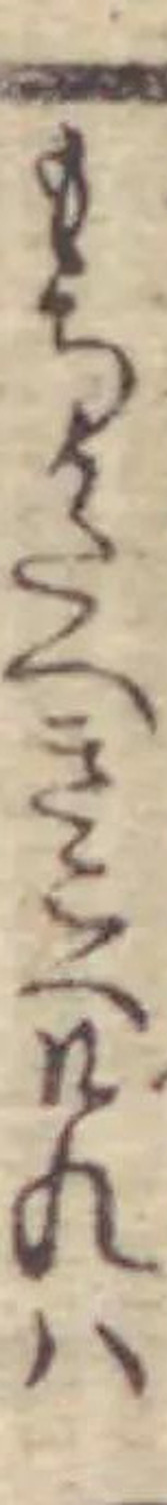もちかたへきこへけれは
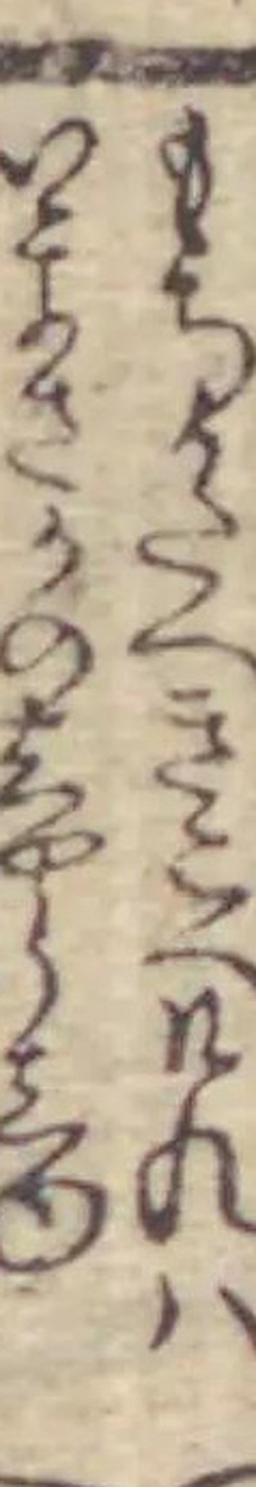いまさかのしやうしゆ
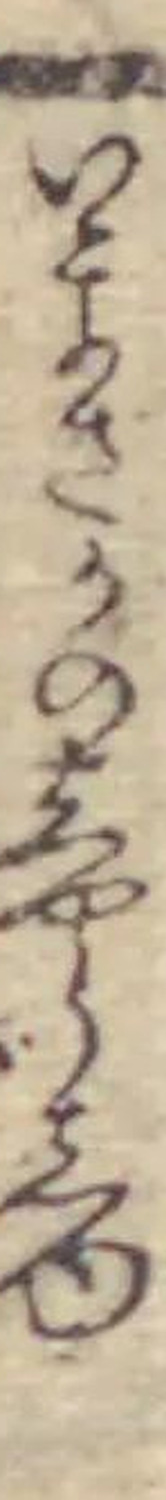いまさかのしやうしゆ
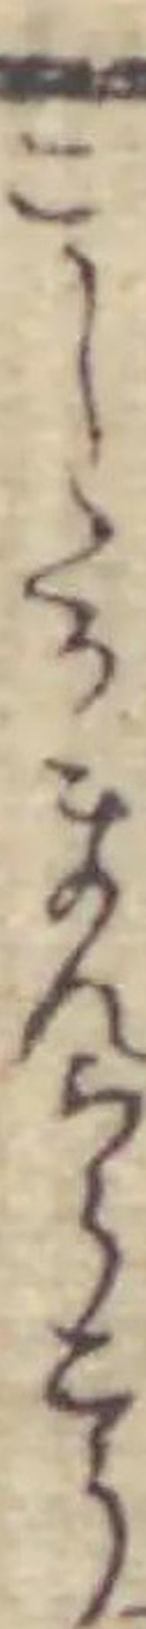こしたかまんぢうこう
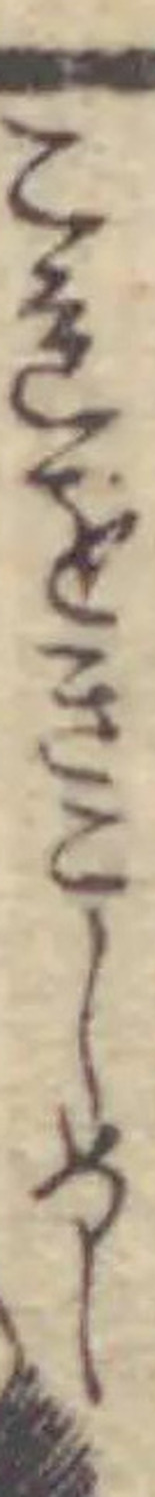これをきこしめし
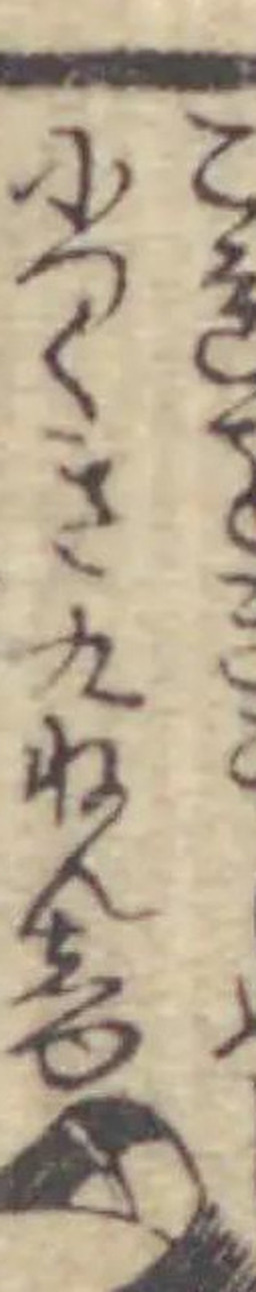につくき九ねんしゆ
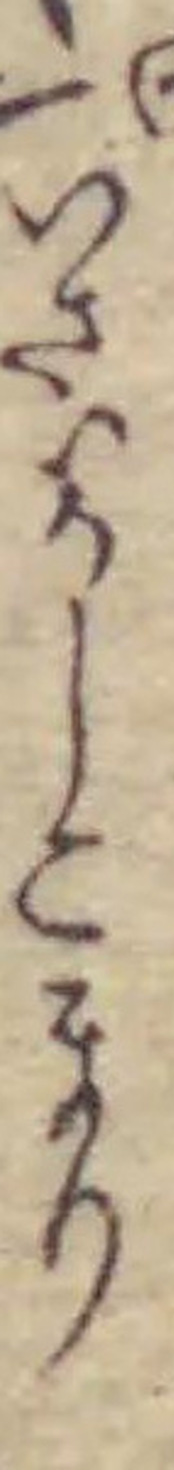いさいかしこまり
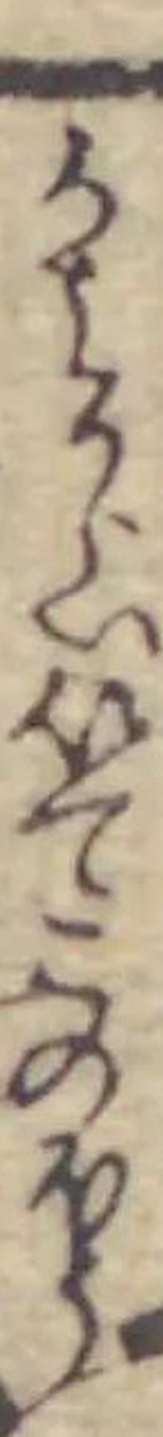かはからい以てこのほう
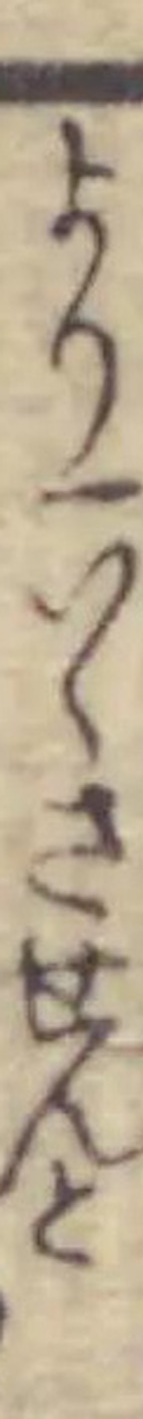より一いくさせんと
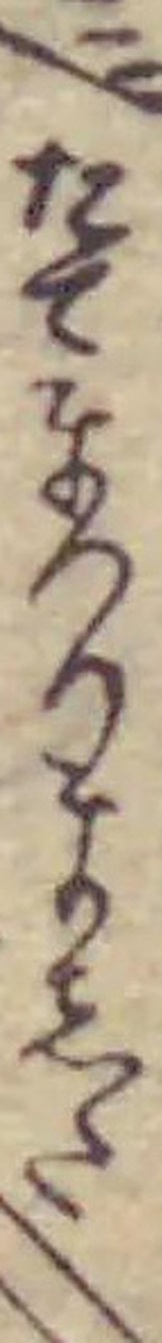たてまつりました
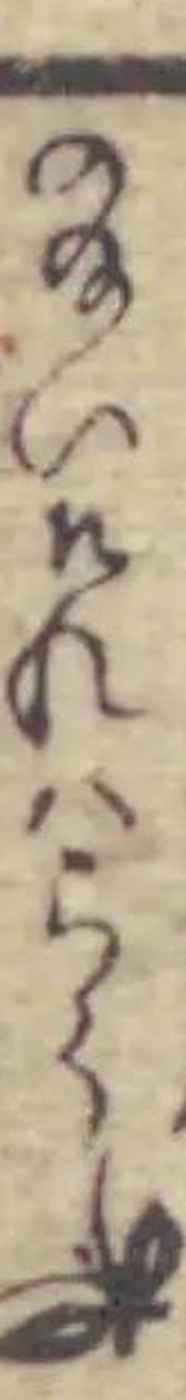の給いけれはちう
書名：餅酒腹中能同志 2巻
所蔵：国立国会図書館 National Diet Library, JAPAN
